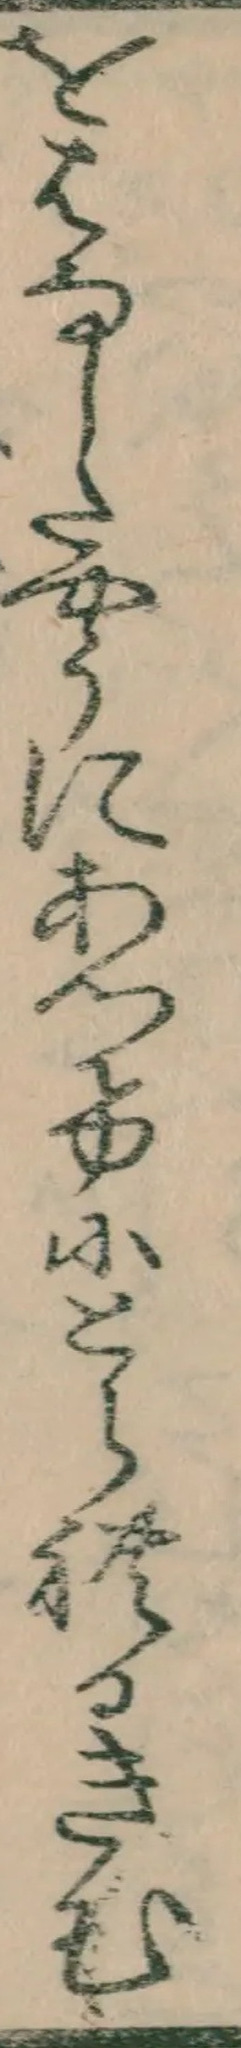をはなしたやうにあつけにとられるきむ
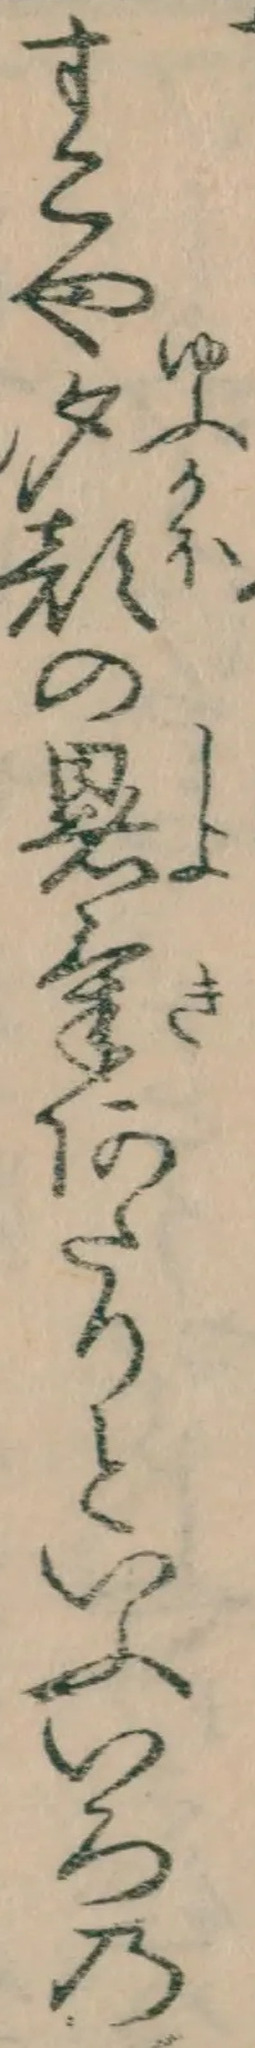すこや夕顔の暑気あたりといふいろの
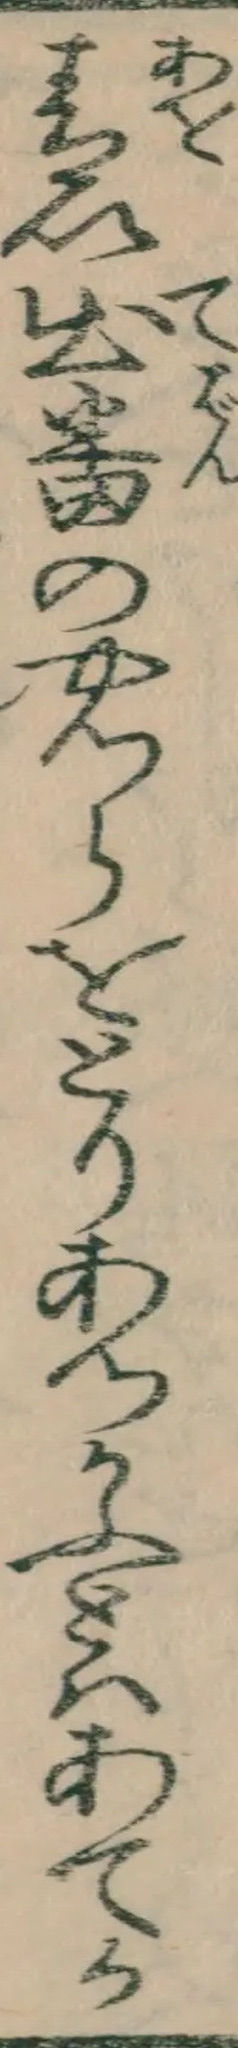青い出番のやつらをとりあつかふとはあてか
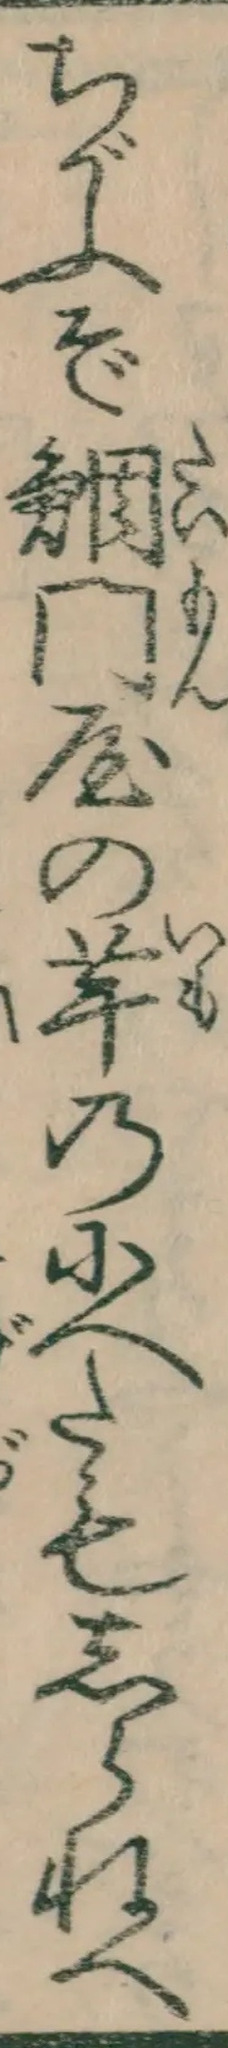ちがふぞ鯛門屋の芋のにへたもしらねへ
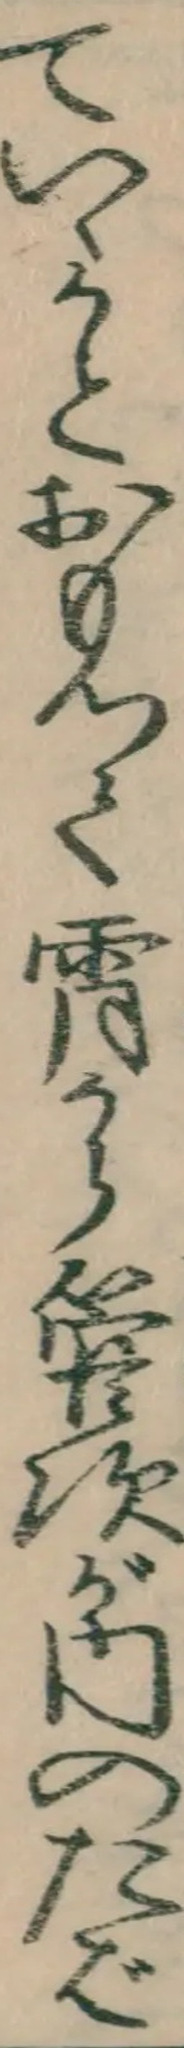ていゝかとおもつて宵から管次が内のたば
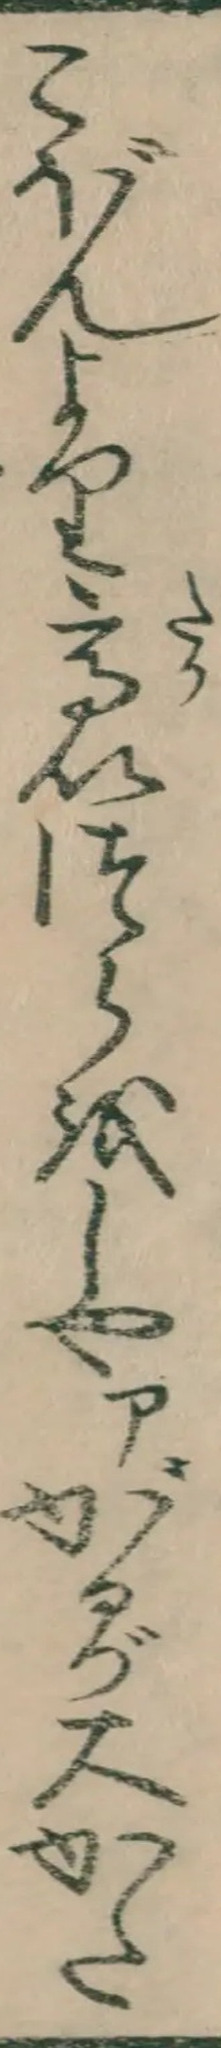こぼんより高いつらをしやァがるが大かた
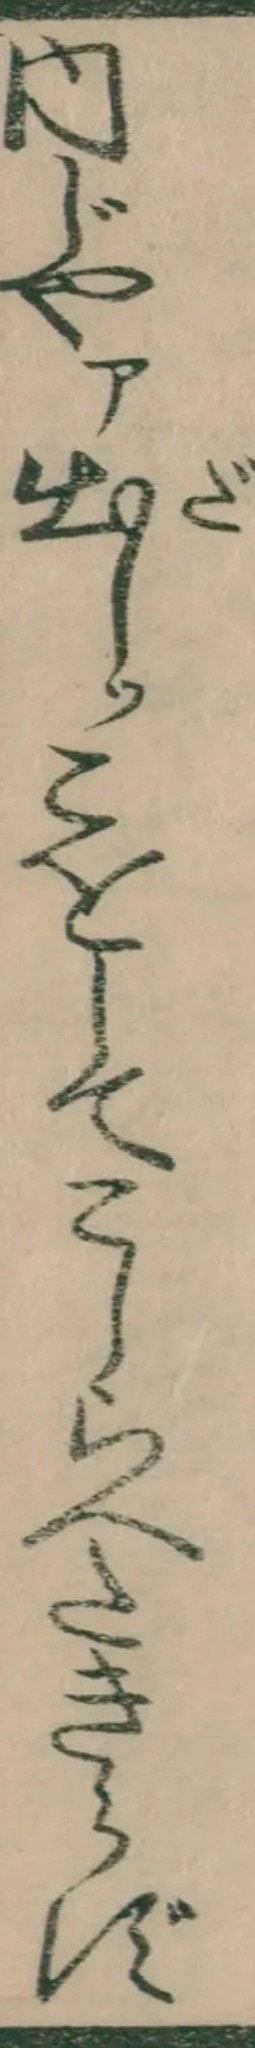内じやァ出しつこをしてこしらへたきらず

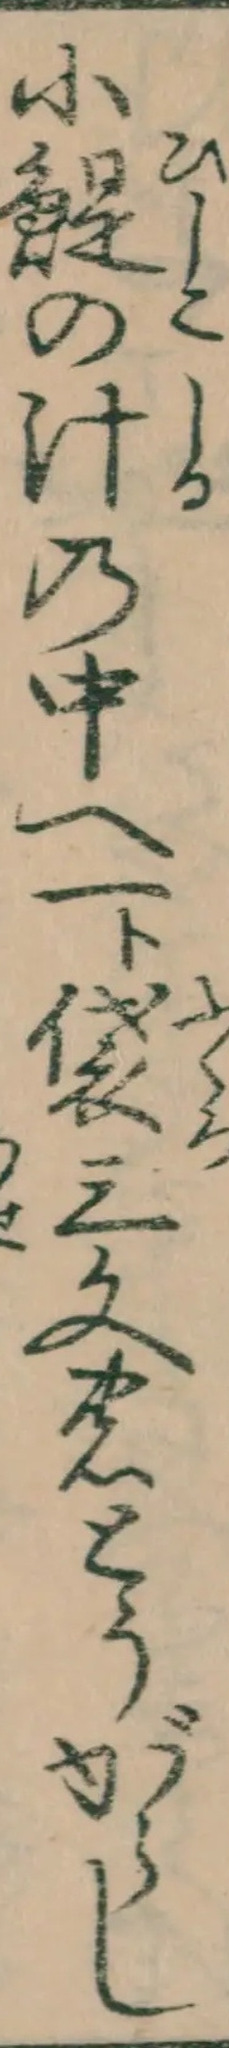に鯷の汁の中へ一と袋三文のとうがらし
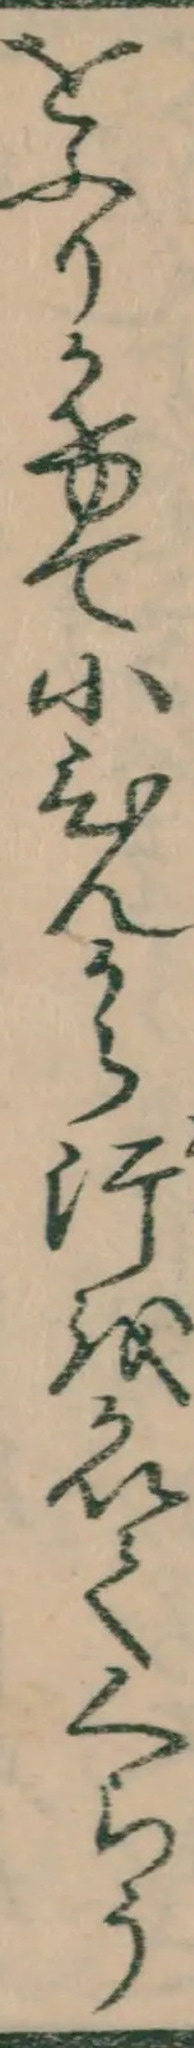をふりかけて小ひんから汗をかいてくらう
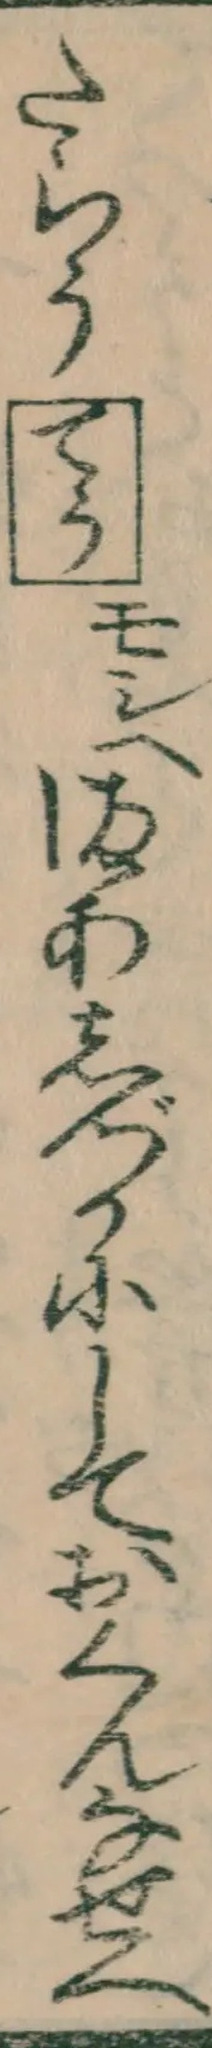たらう〈てう〉モシヘまあしづかにしておくんなせへ
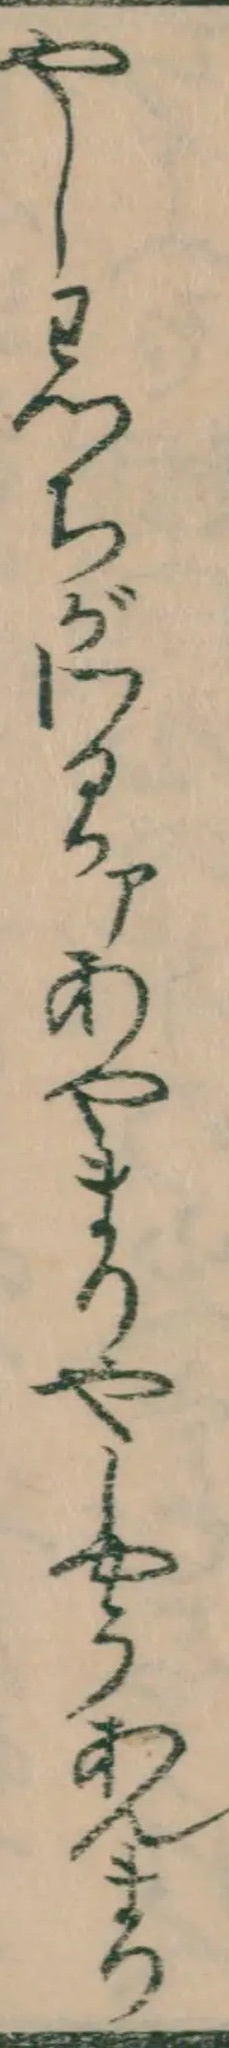やしわつちがわるかァあやまりやしやうあんまり
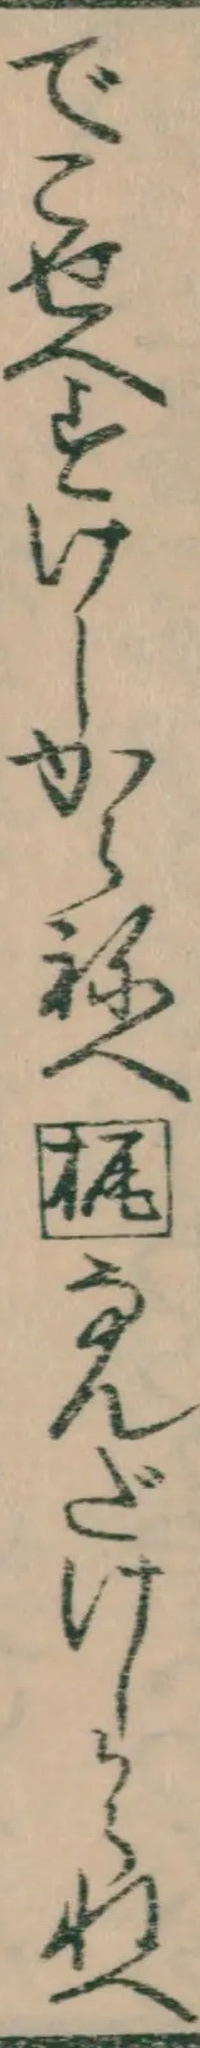でこせへすけしからねへ〈梶〉なんだけしからねへ
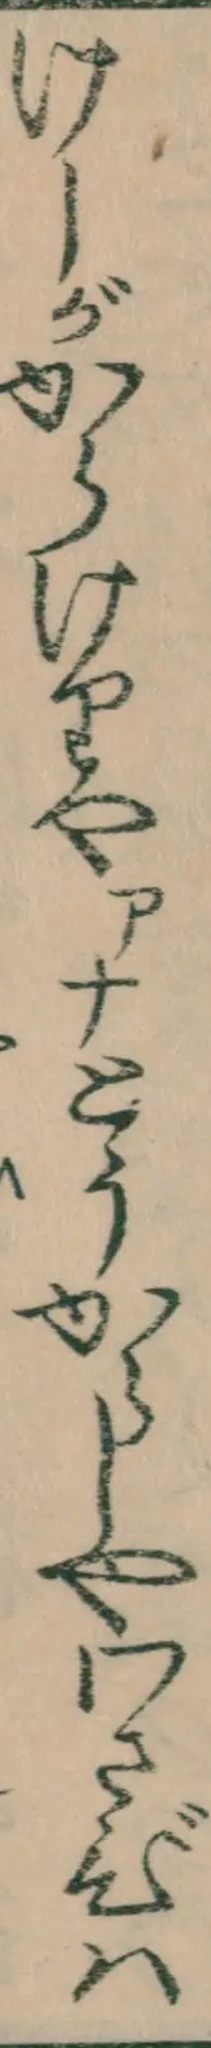けしがからけりやアナとうからしやわさびは
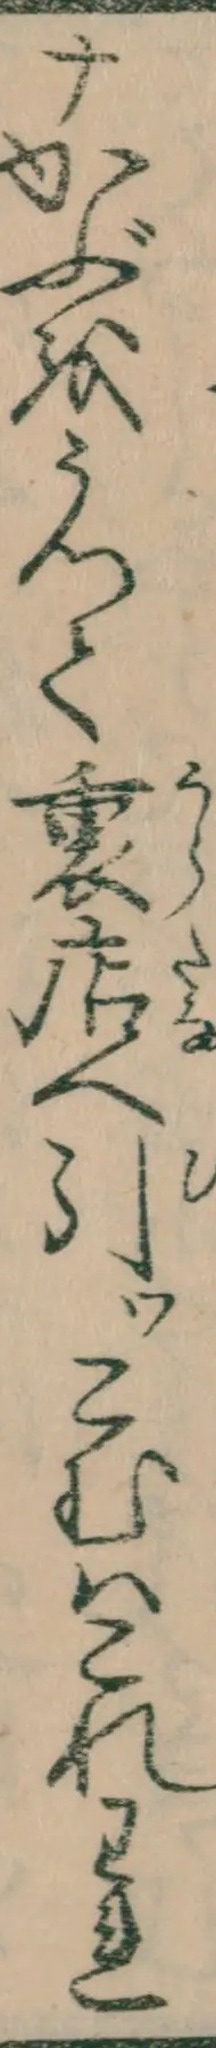ナかぶをうつて裏店へ引つこむはこれわれ
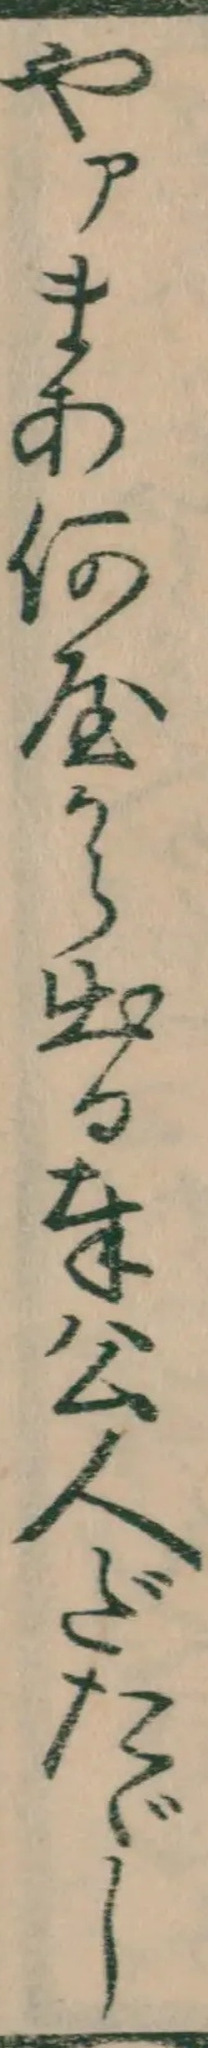やァまあ何屋から出る奉公人だたゞし
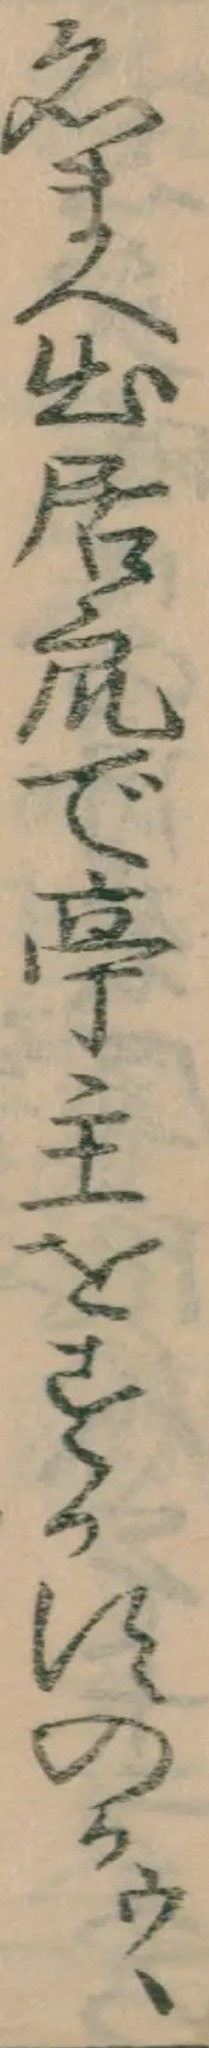名まへ出居衆で亭主をすかすのかウヽ
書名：教訓読本：大礒風俗仕懸文庫
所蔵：国立国会図書館 National Diet Library, JAPAN
